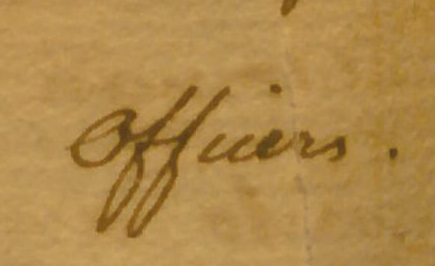officers
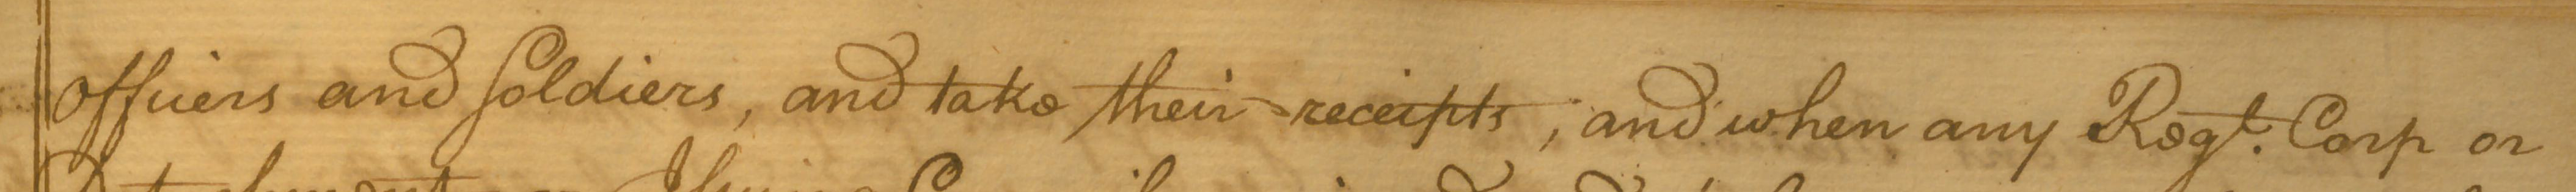officers and soldiers and take their receipts; and when any Reg^t Corp or
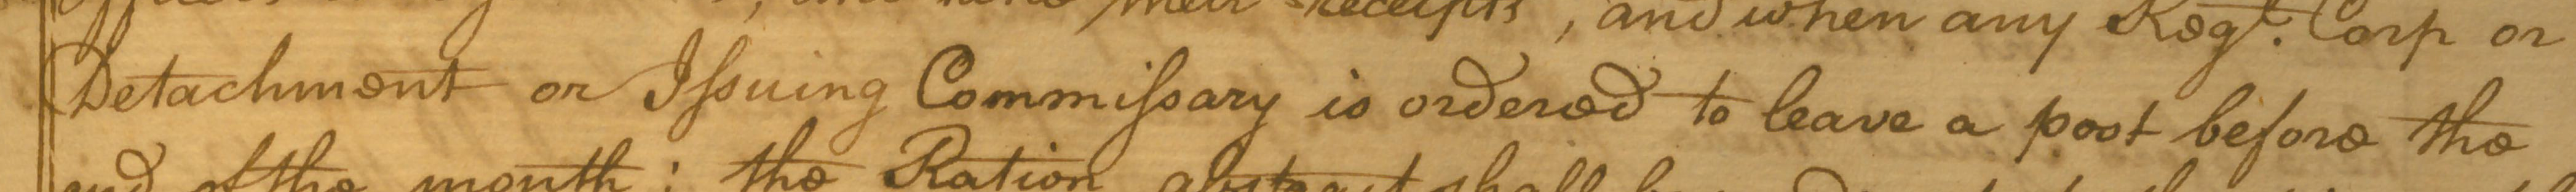Detachment or Issuing Commissary is ordered to leave a post before the
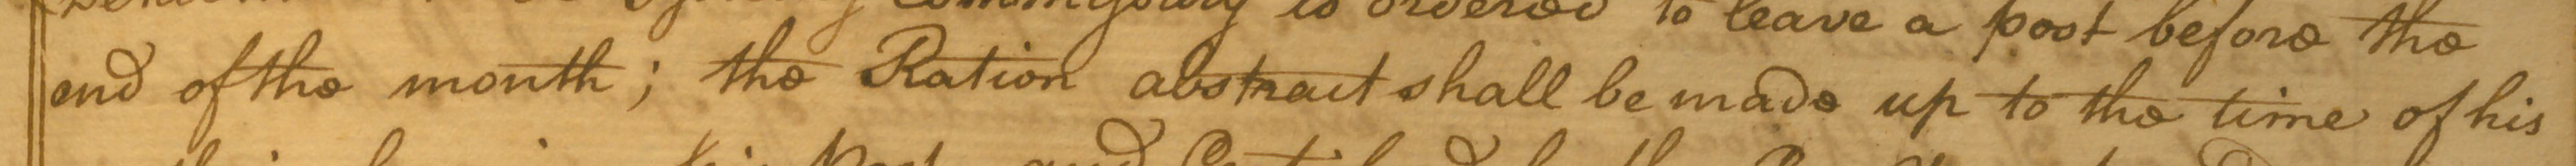end of the month; the Ration abstract shall be made up to the time of his
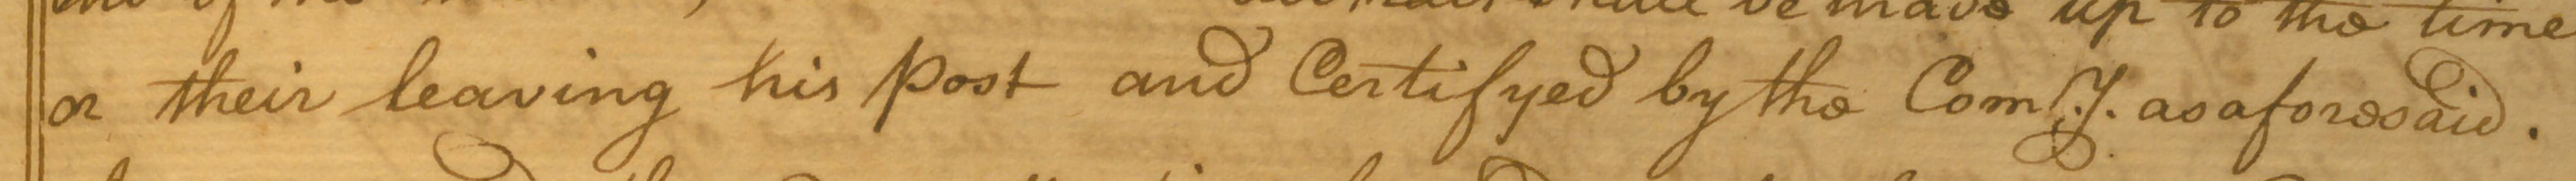or their leaving his Post and Certifyed by the Com^y. as aforesaid.
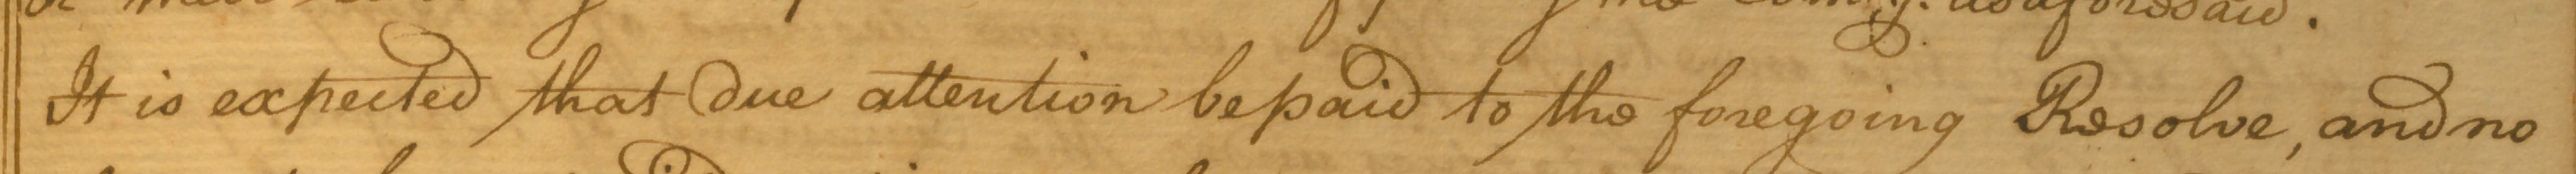It is expected that due attention be paid to the foregoing Resolve, and no
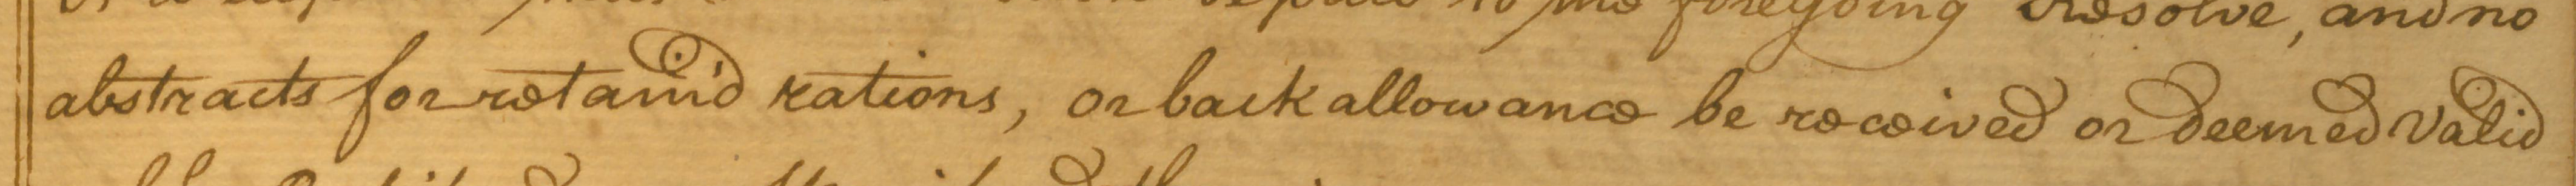abstracts for retain'd rations, or back allowance be received or deemed valid
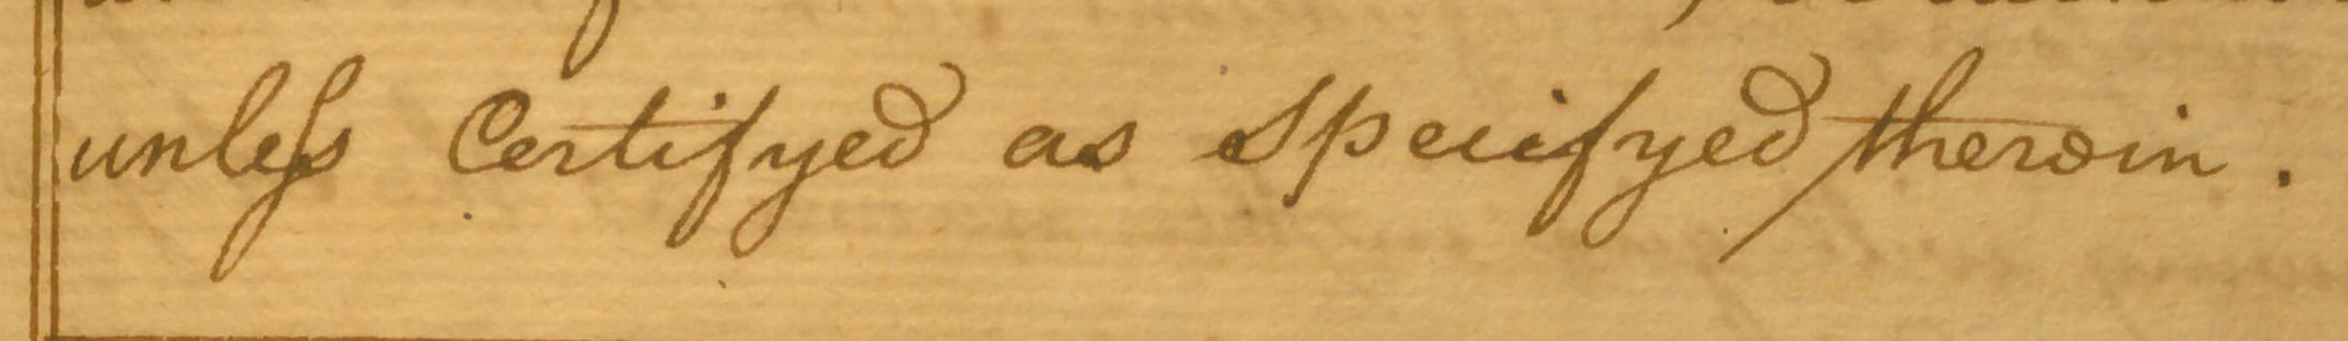unless Certifyed as specifyed therein.
